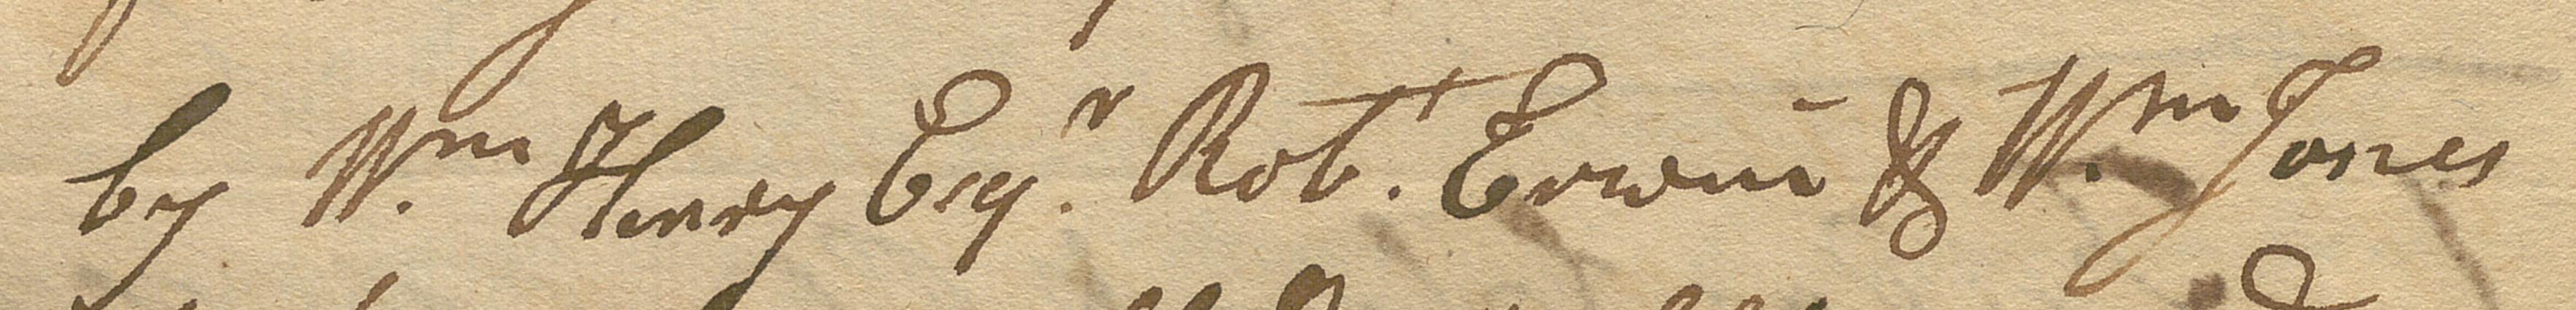by W^m. Henry Esq^r. Rob^t. Erwin & W^m. Jones
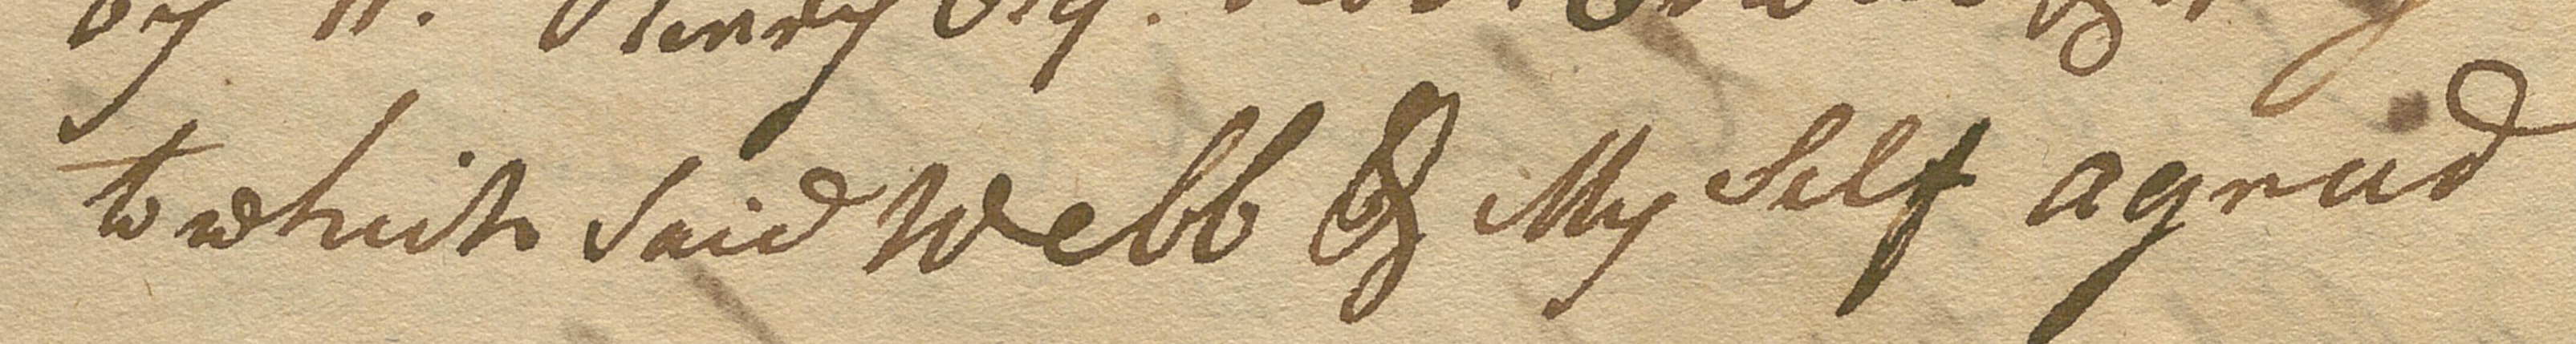to which Said Webb & My self agreed
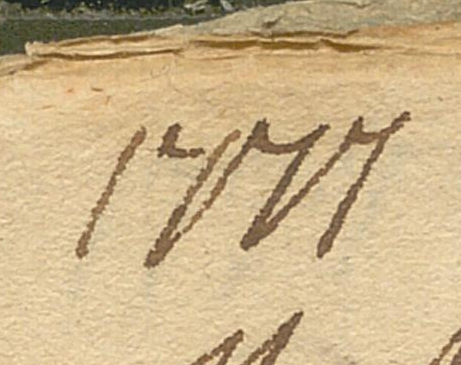1777
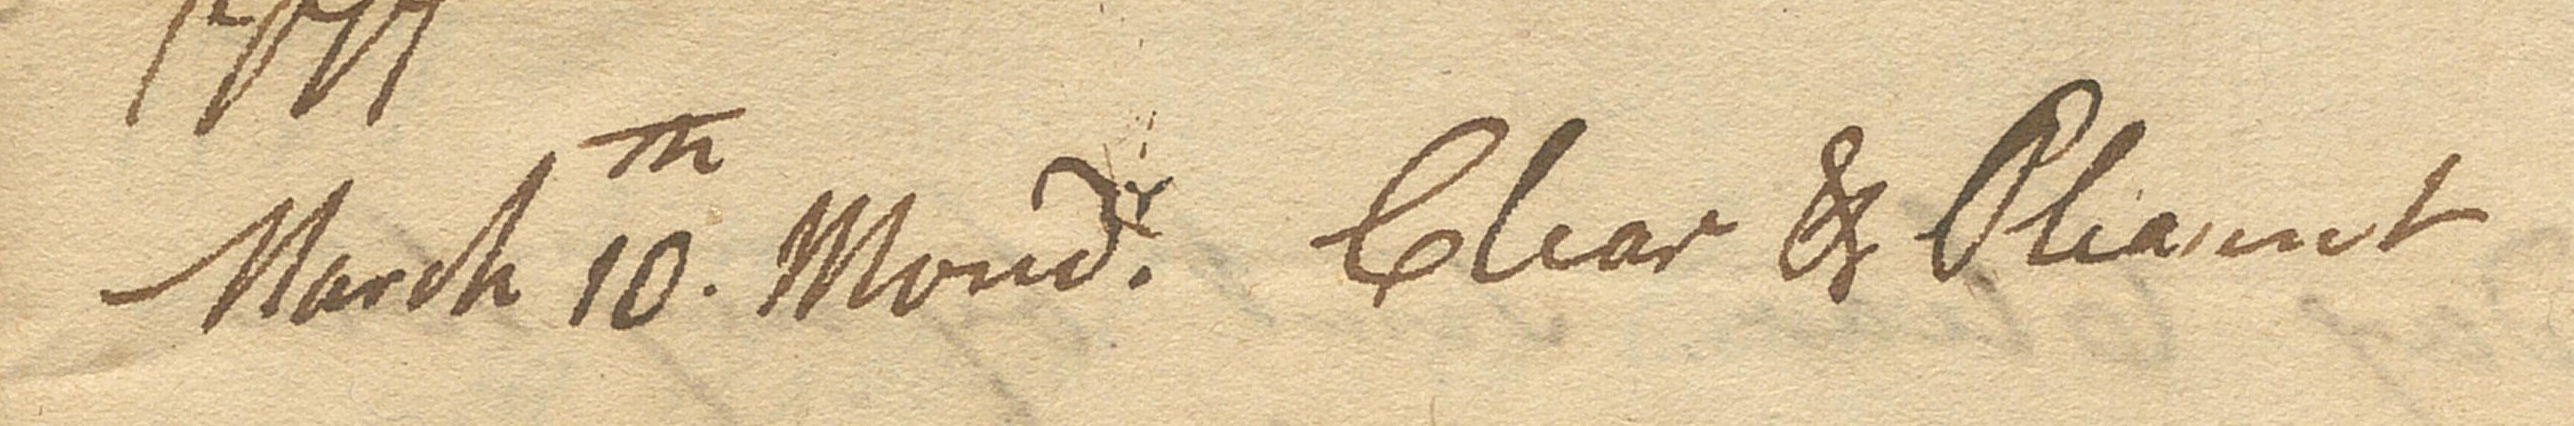March 10^th. Mond. Clear & Pleaent
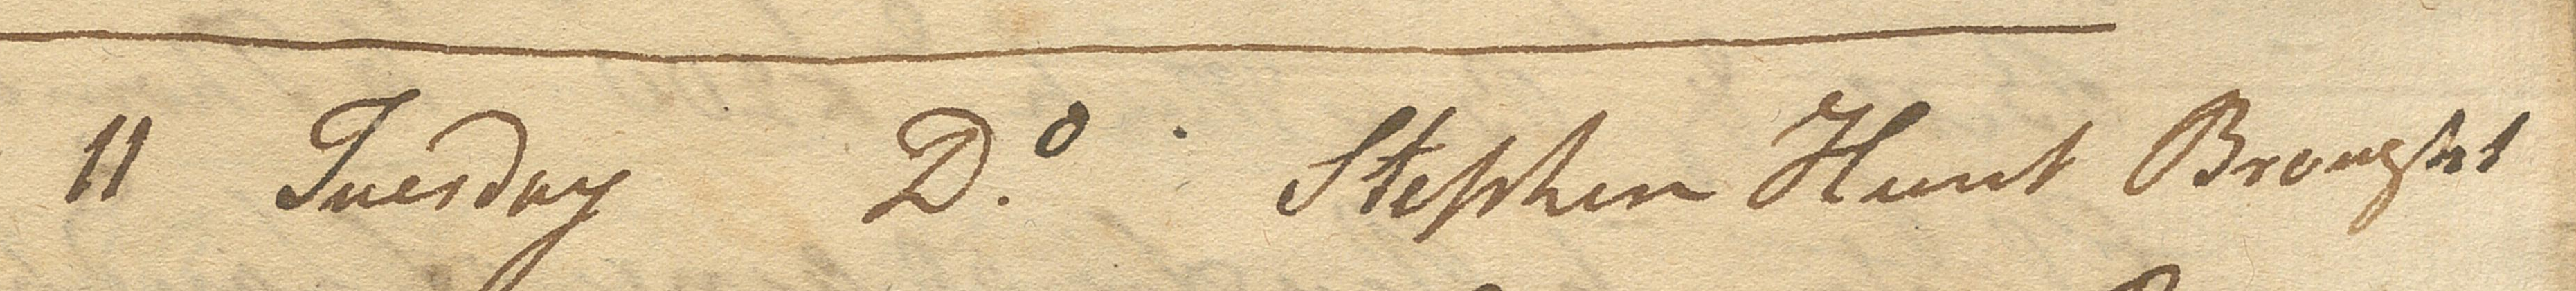11 Tuesday D^o. Stephen Hunt Brought
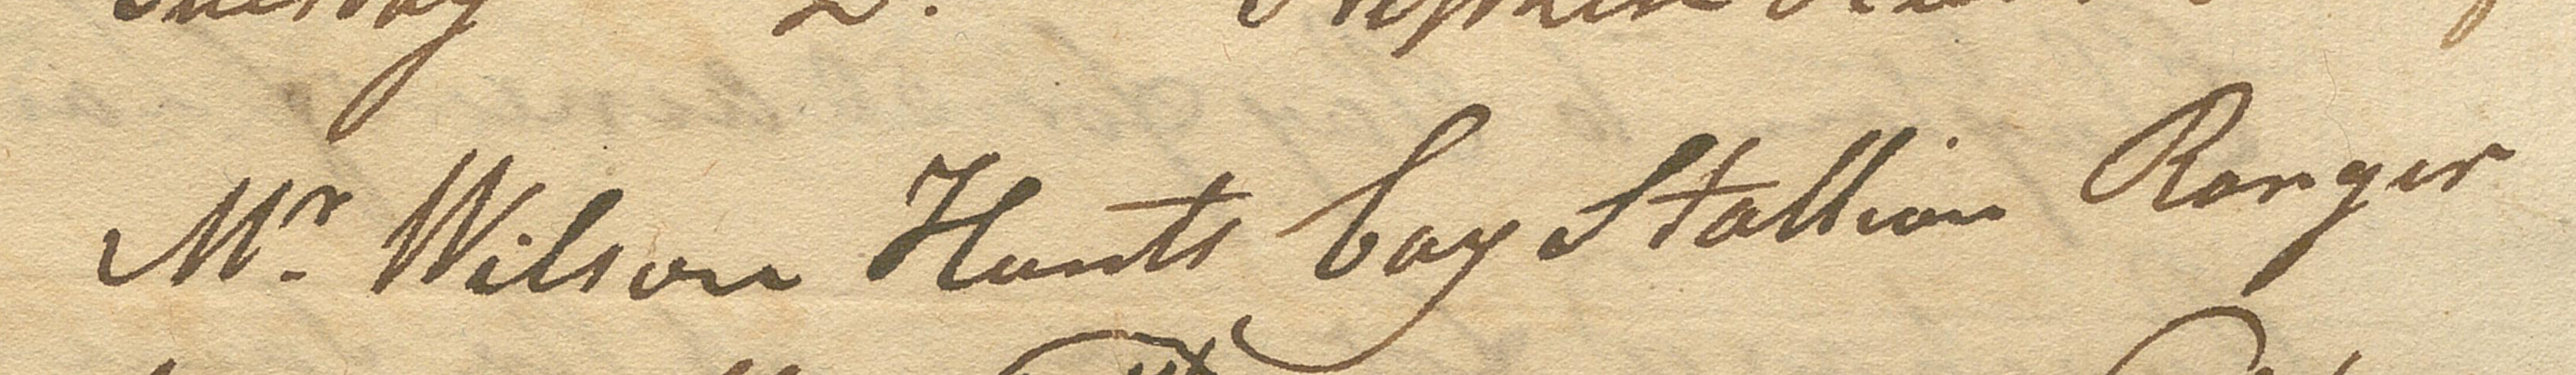M^r. Wilson Hunts bay Stallion Ranger
